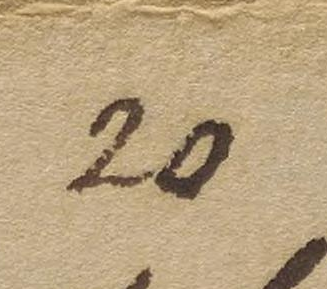20
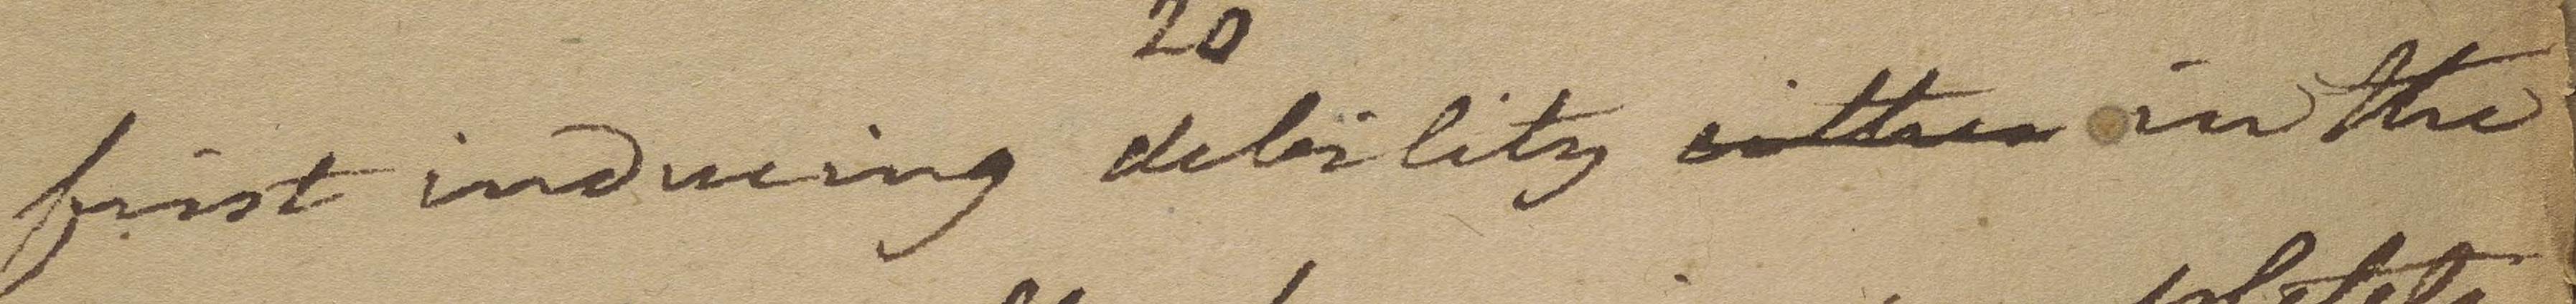first inducing debility [either] in the
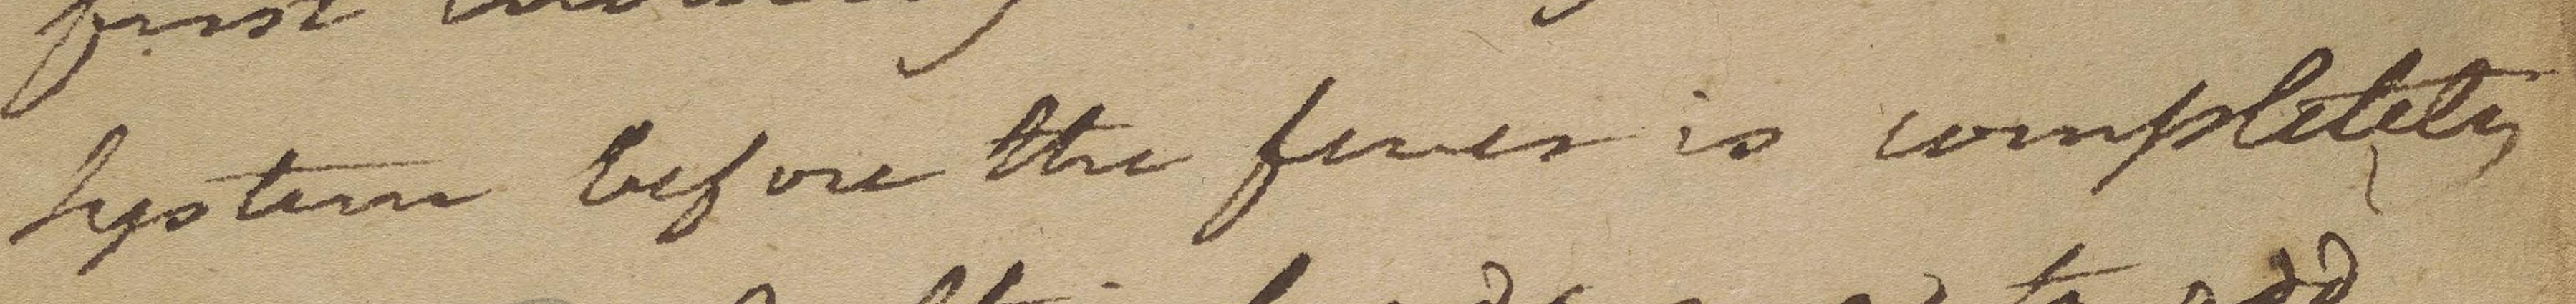system before the fever is completely
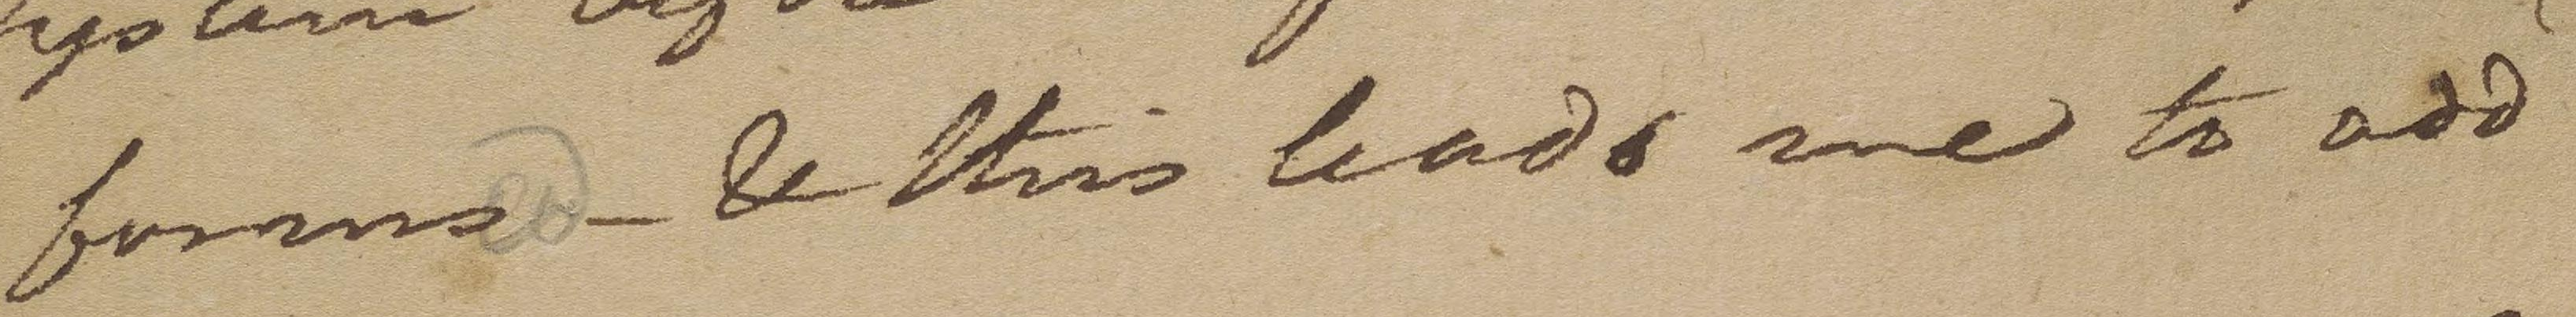forms- & this leads one to add
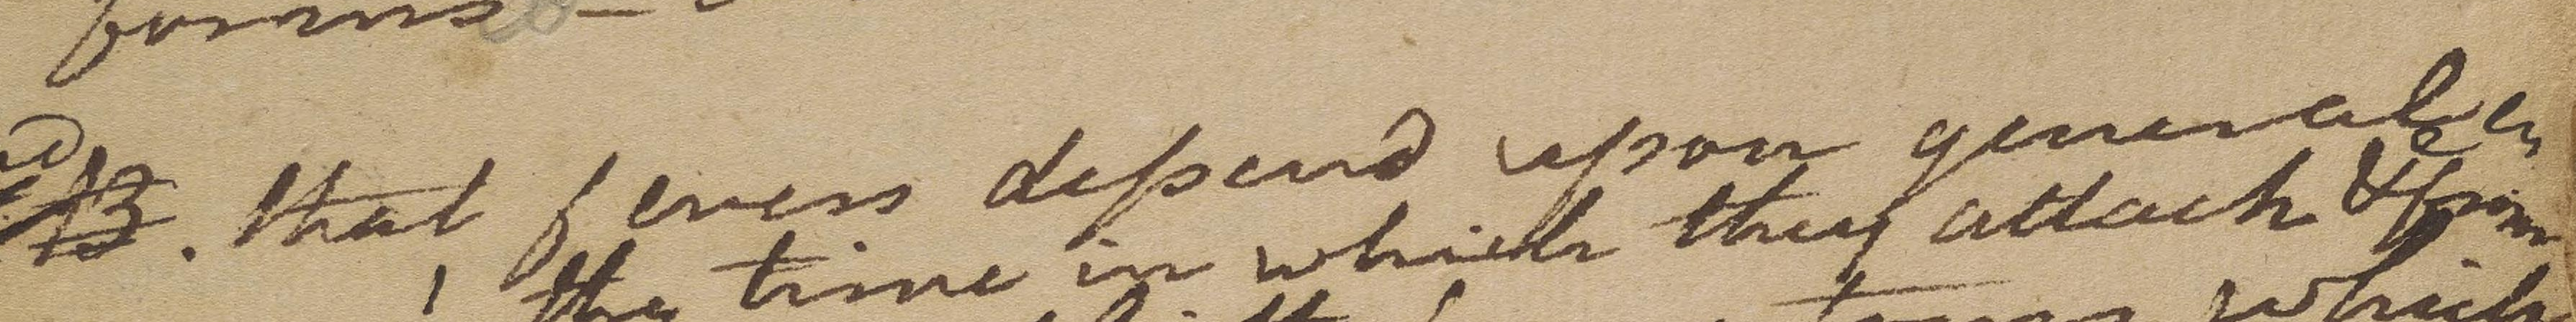13. that fevers depend upon general
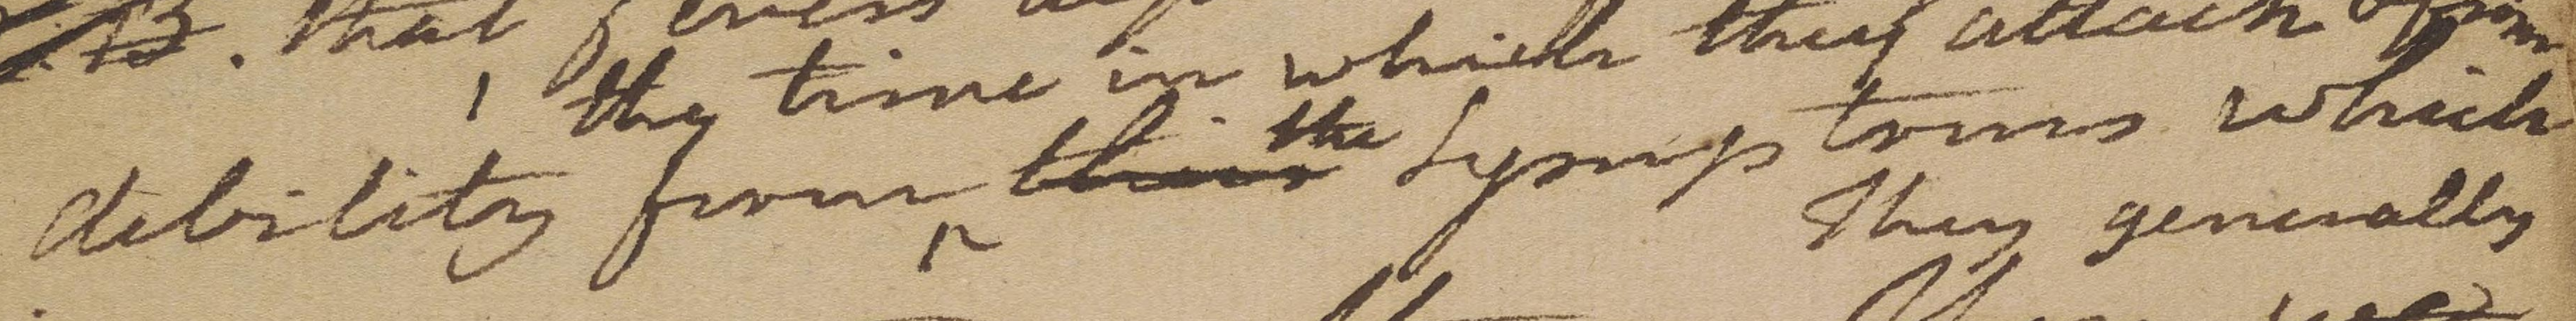debility from ^ [their] symptoms which
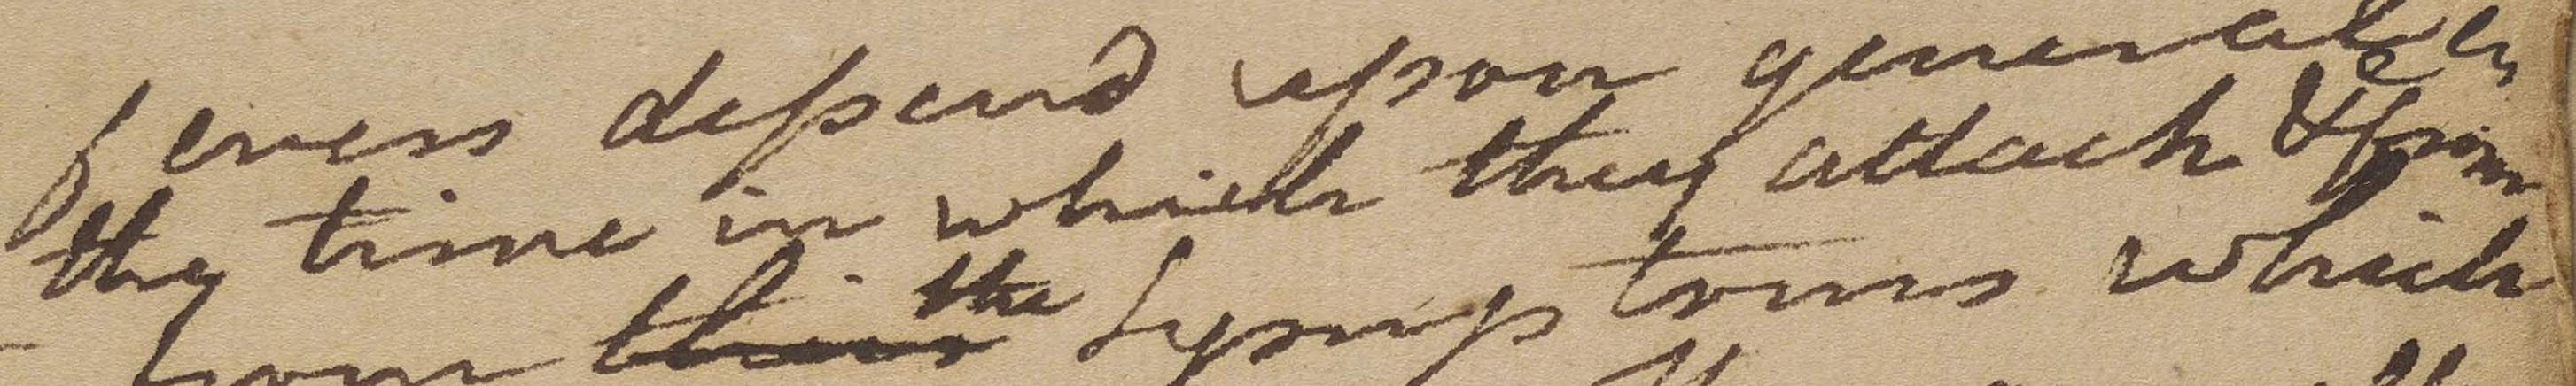the time in which they attack & form
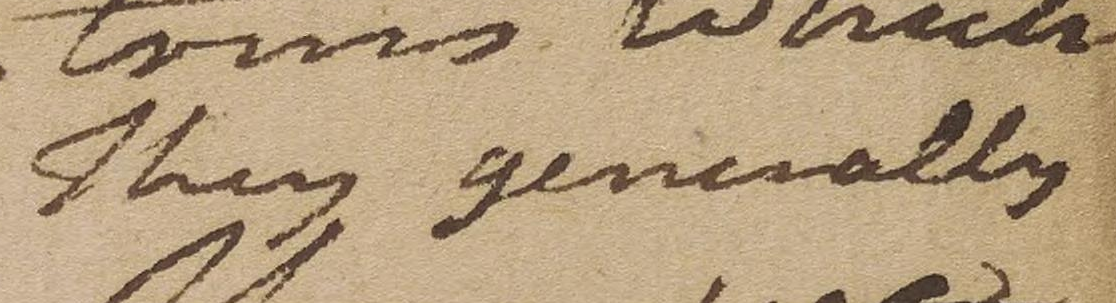They generally
